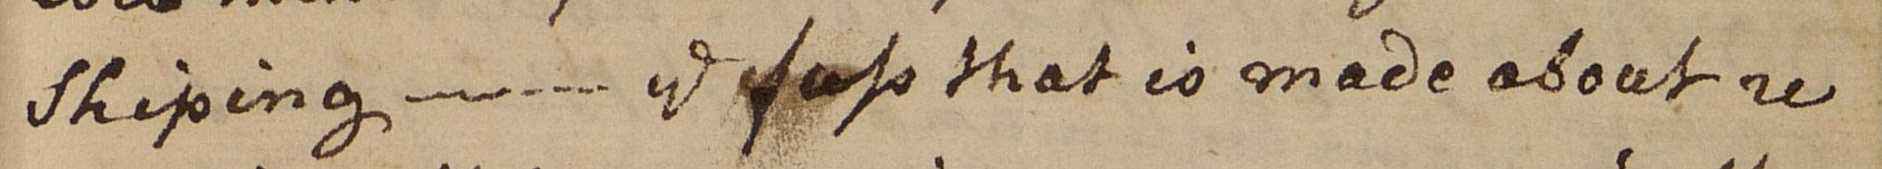Shiping-- y^e fuss that is made about re
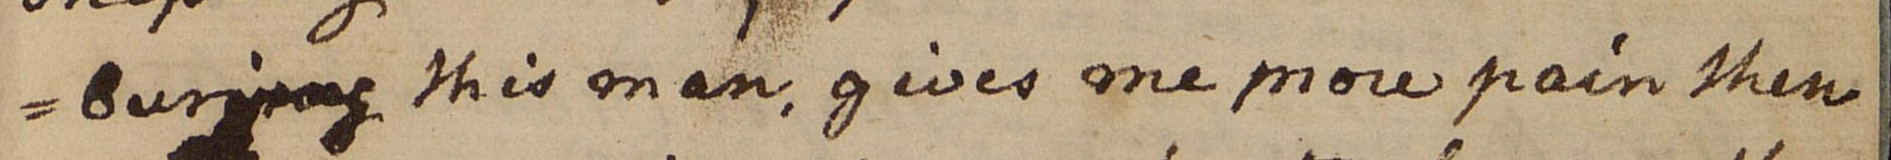-burying this man, gives me more pain then
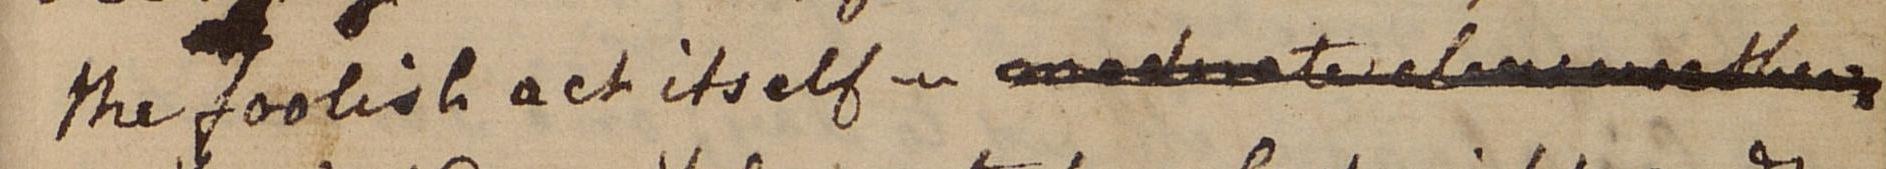the foolish act itself- [__________________________]
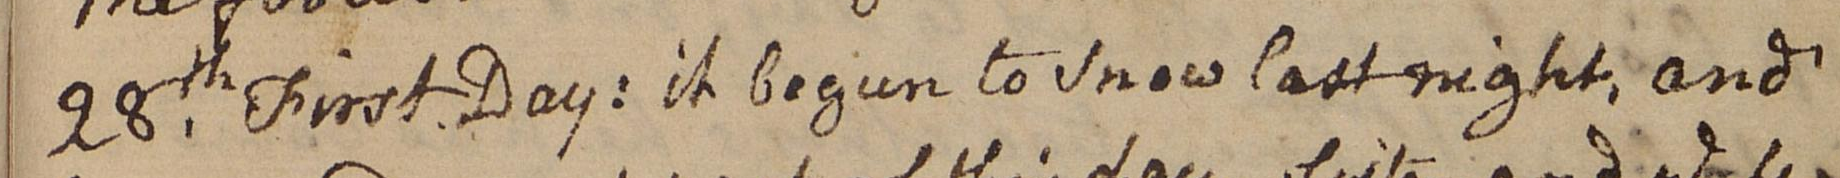28^th. First Day: it begun to Snow last night, and
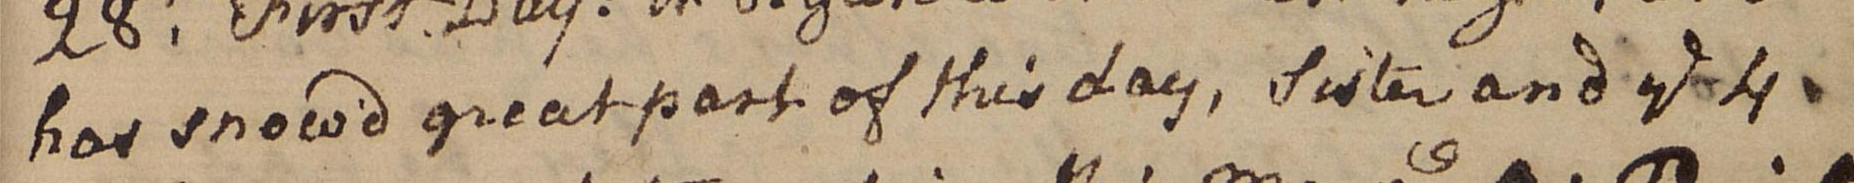has snow'd great part of this day, Sister and y^e 4
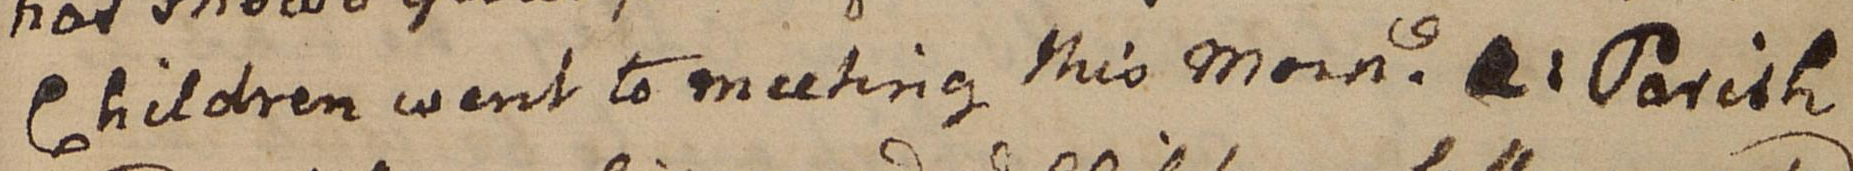Children went to meeting this Morn^g. A: Parish
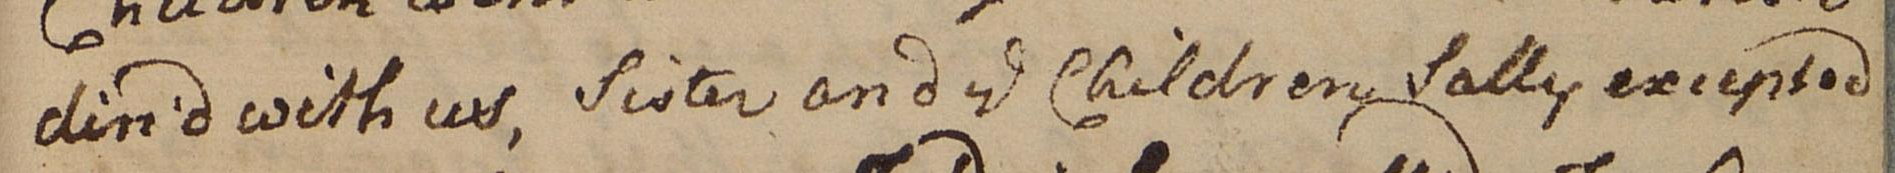din'd with us, Sister and y^e Children Sally excepted
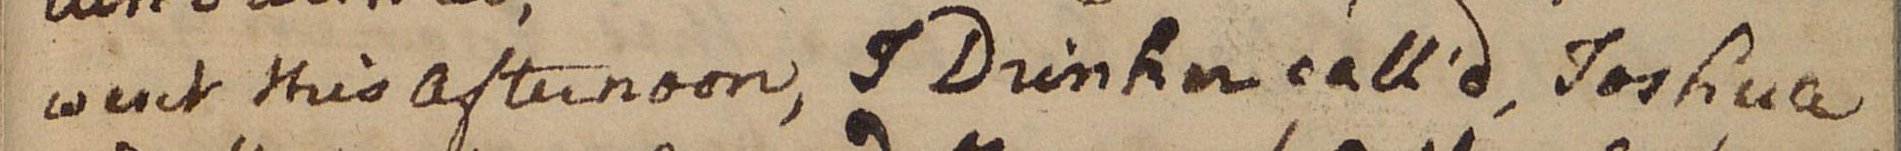went this Afternoon, I Drinker call'd, Joshua,
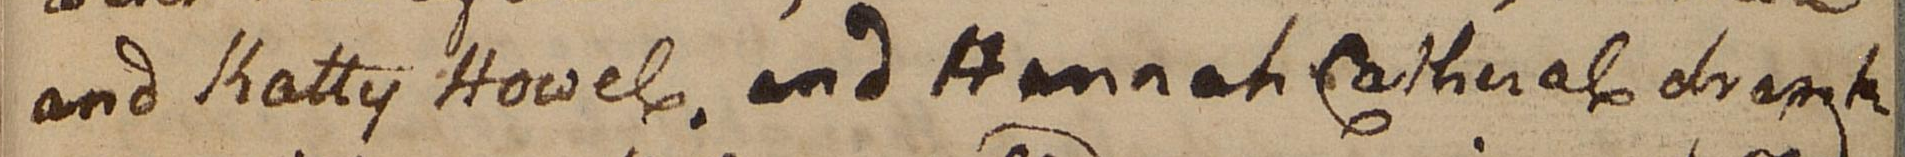and Katty Howel, and Hannah Catheral drank
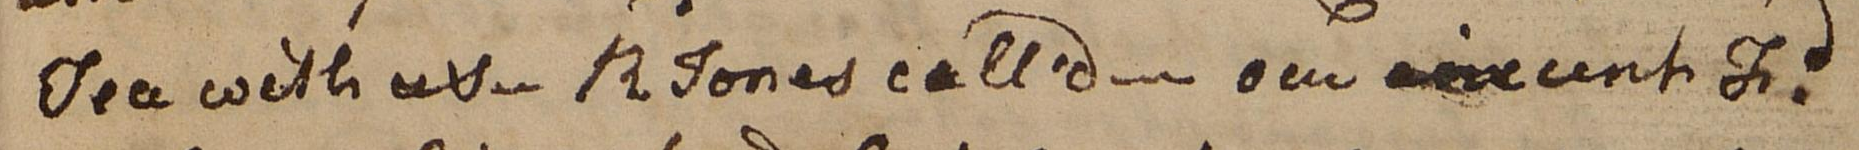Tea with us- R. Jones call'd- our ancient F^d.
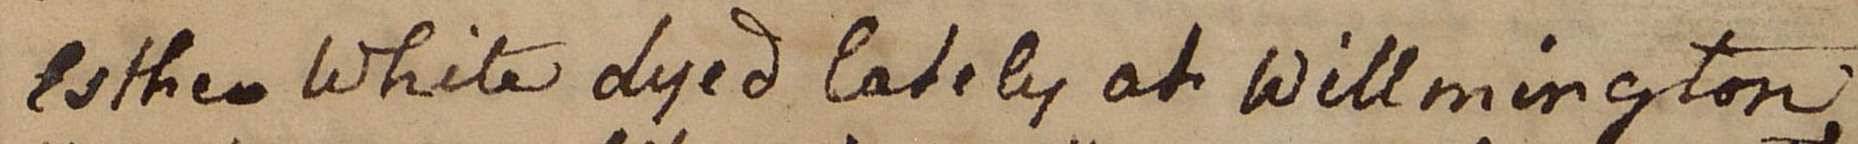Esther White dyed lately at Willmington
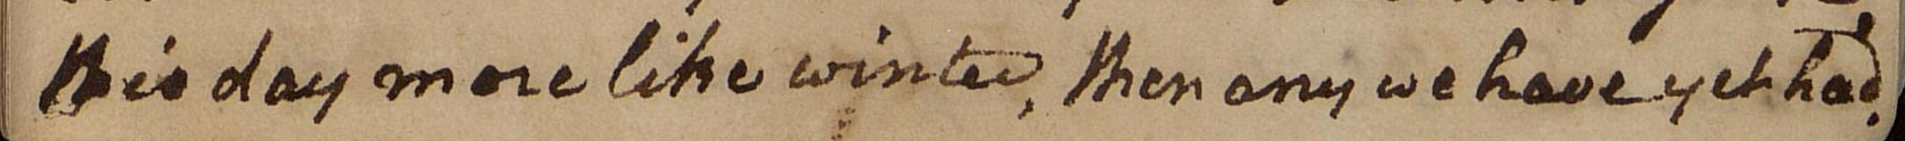this day more like winter, then any we have yet had
